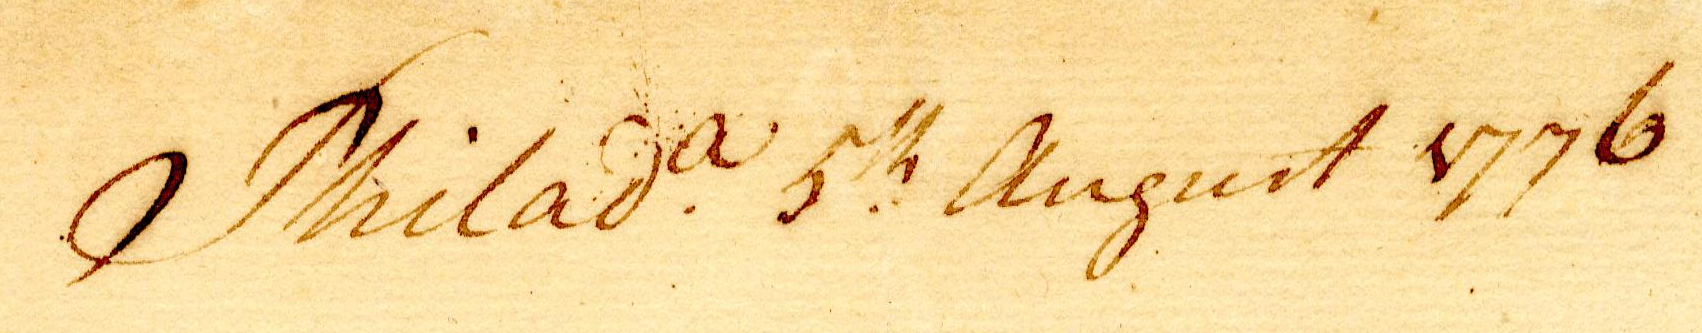Philad^a. 5^th. August 1776
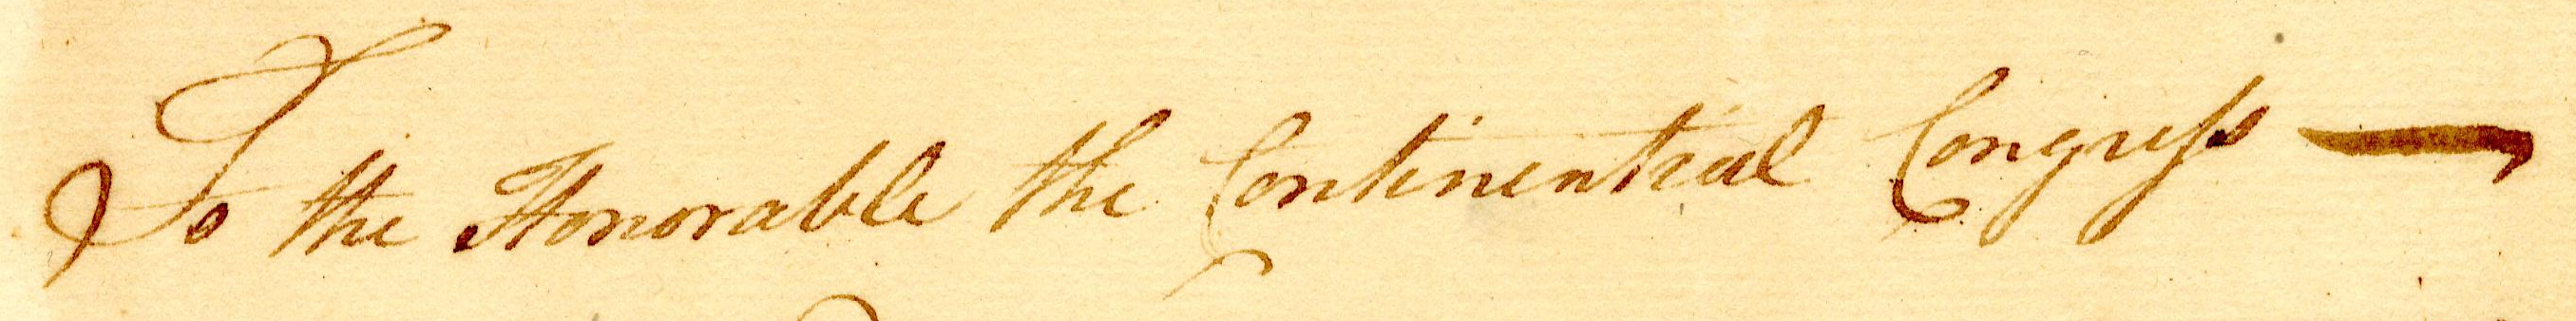To the Honorable the Continential Congress-
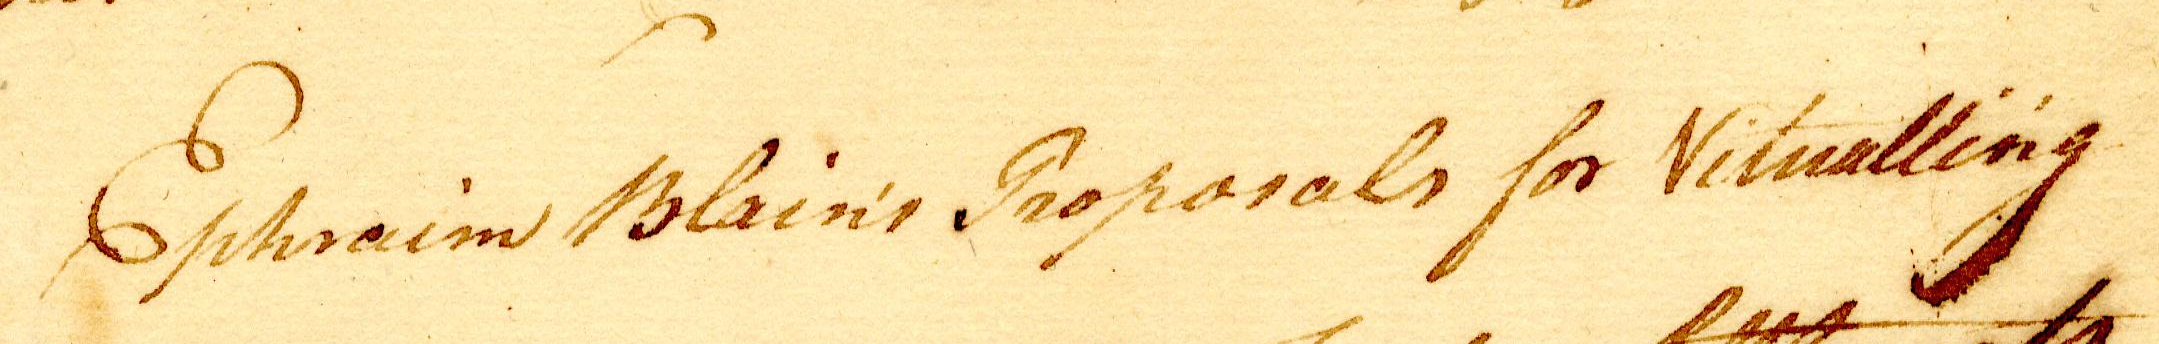Ephraim Blain's Proposals for Vitualling
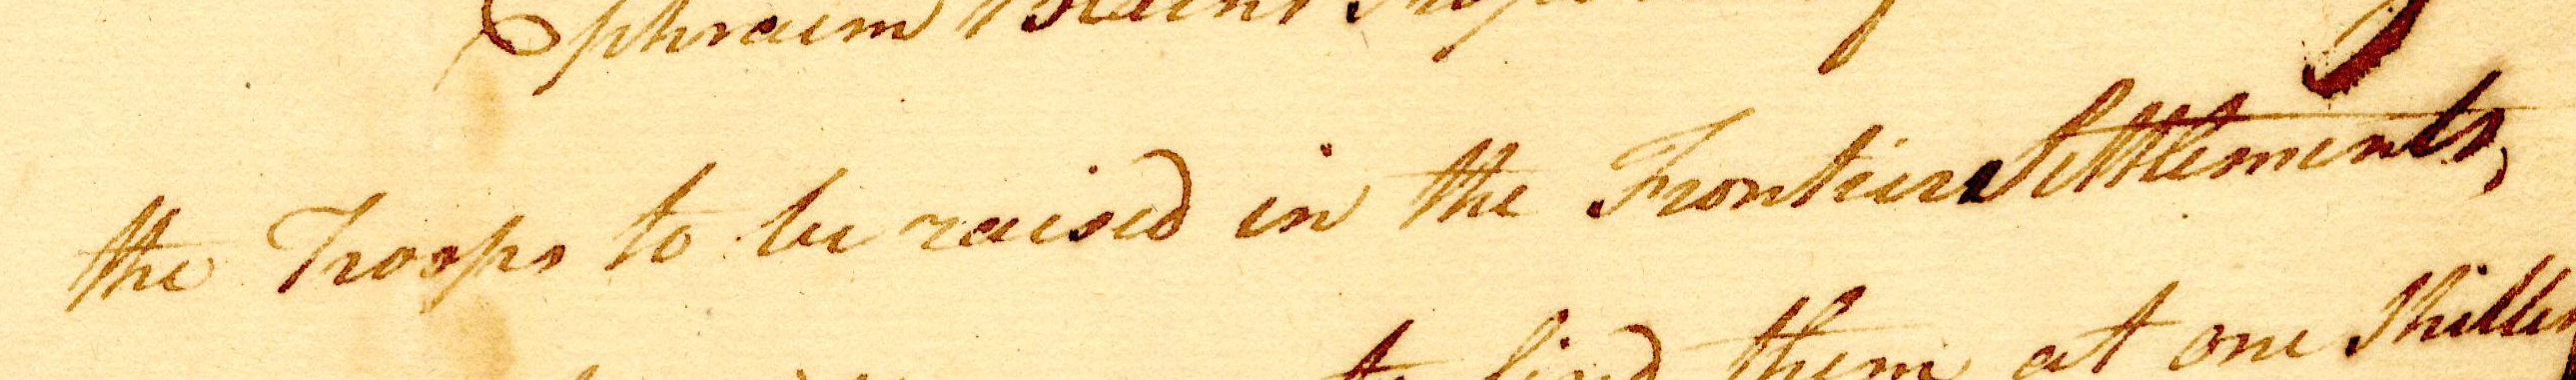the Troops to be raised in the Frontier Settlements,
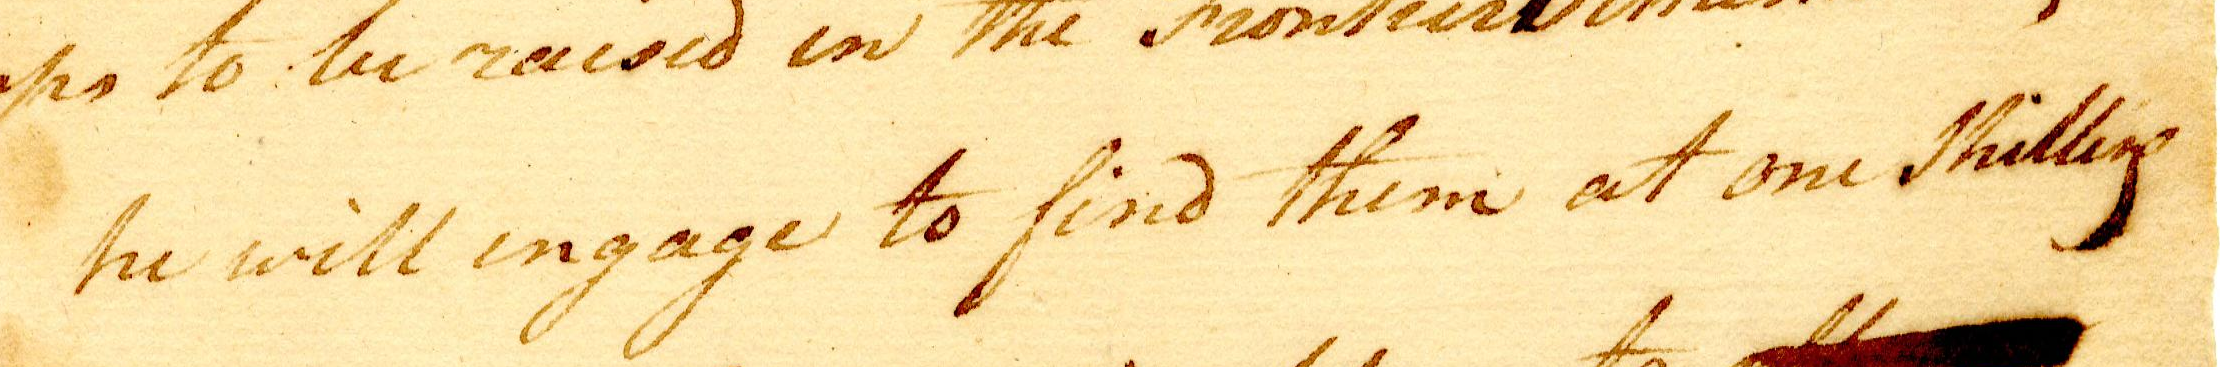he will engage to find them at one Shilling
